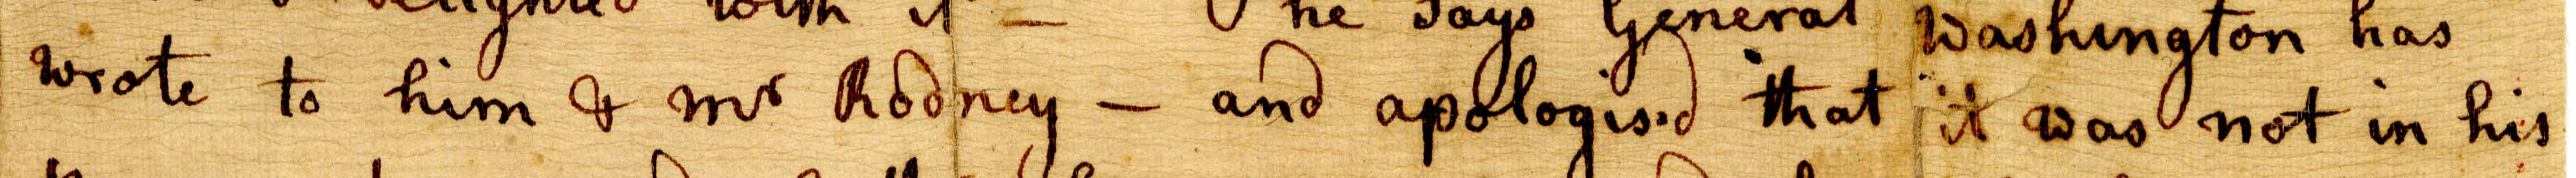wrote to him & M^r Rodney- and apologis'd that it was not in his
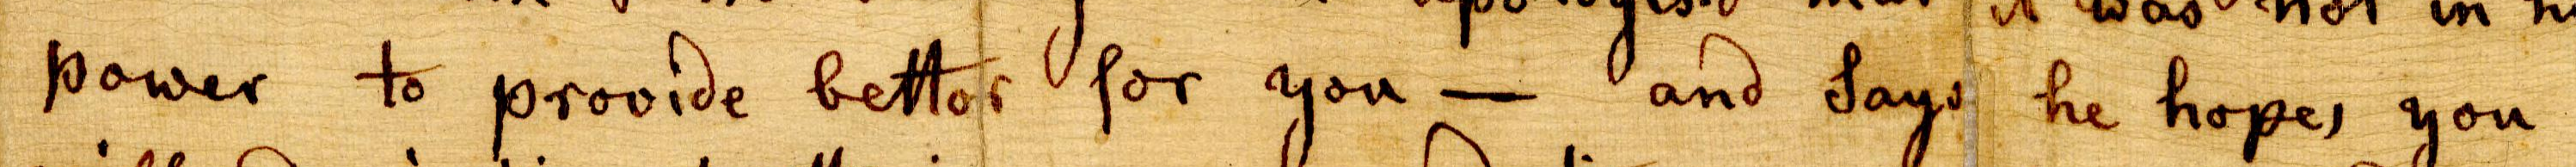power to provide better for you- and Says he hopes you
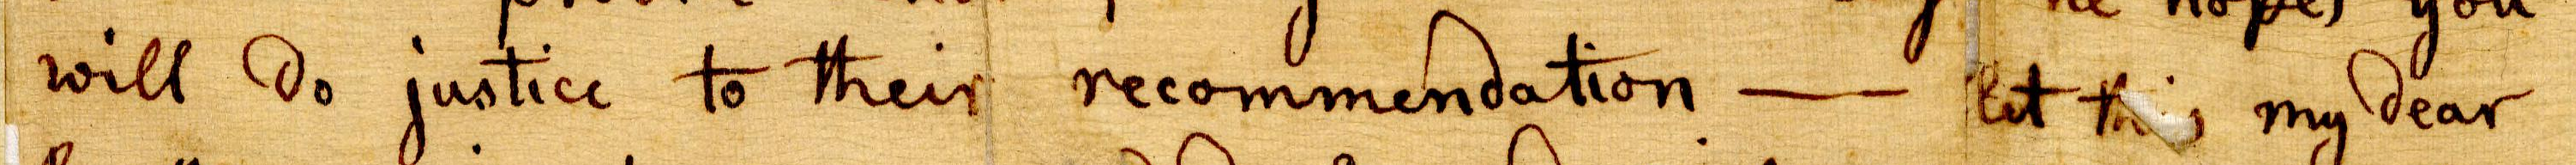will do justice to their recommendation- let th[_]s my dear
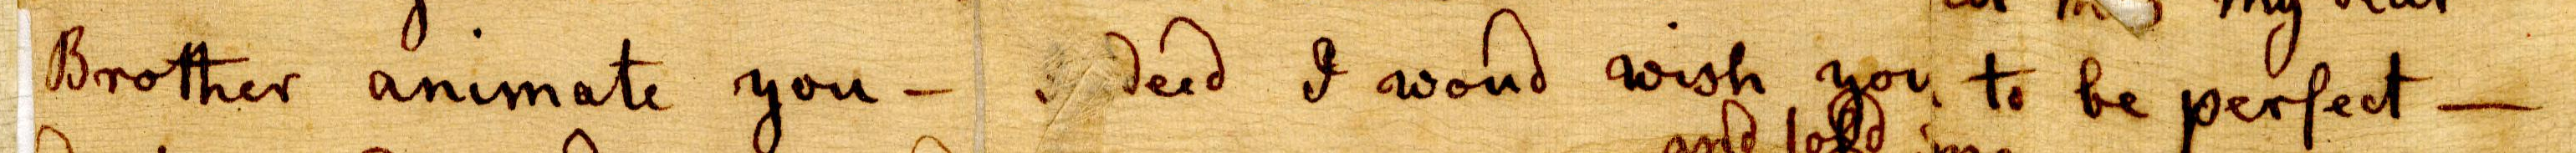Brother animate you-[__]deed I woud wish you to be perfect-
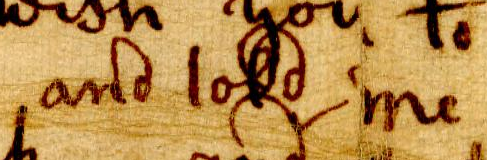and told me
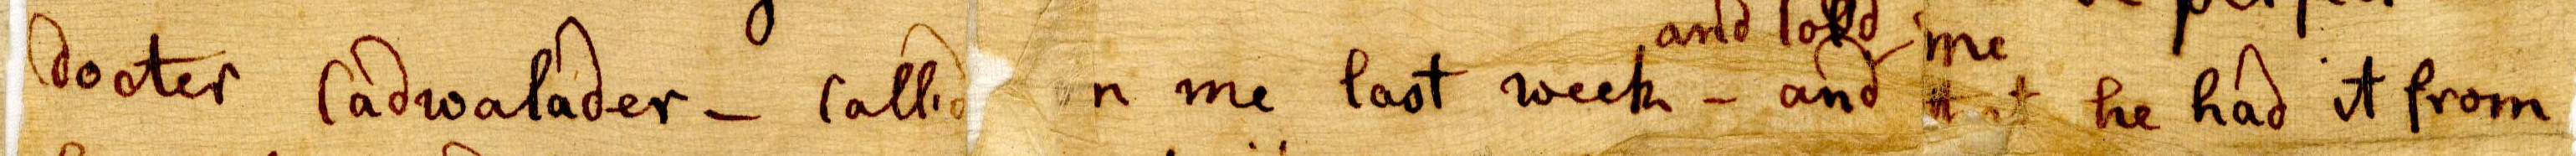docter Cadwalader- call'd on me last week- and ^ [that] he had it from
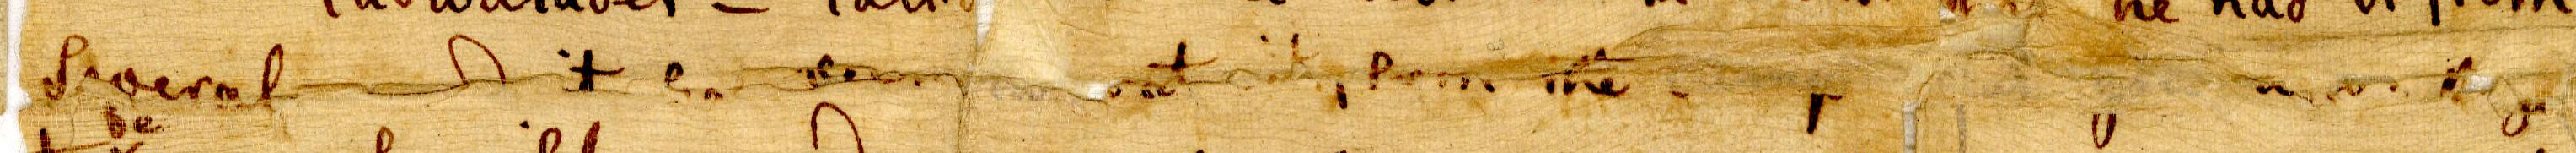several [___] [_]t [______] [__]t [__] from the [__]p [__] [_______]
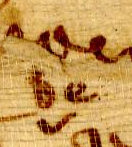be
